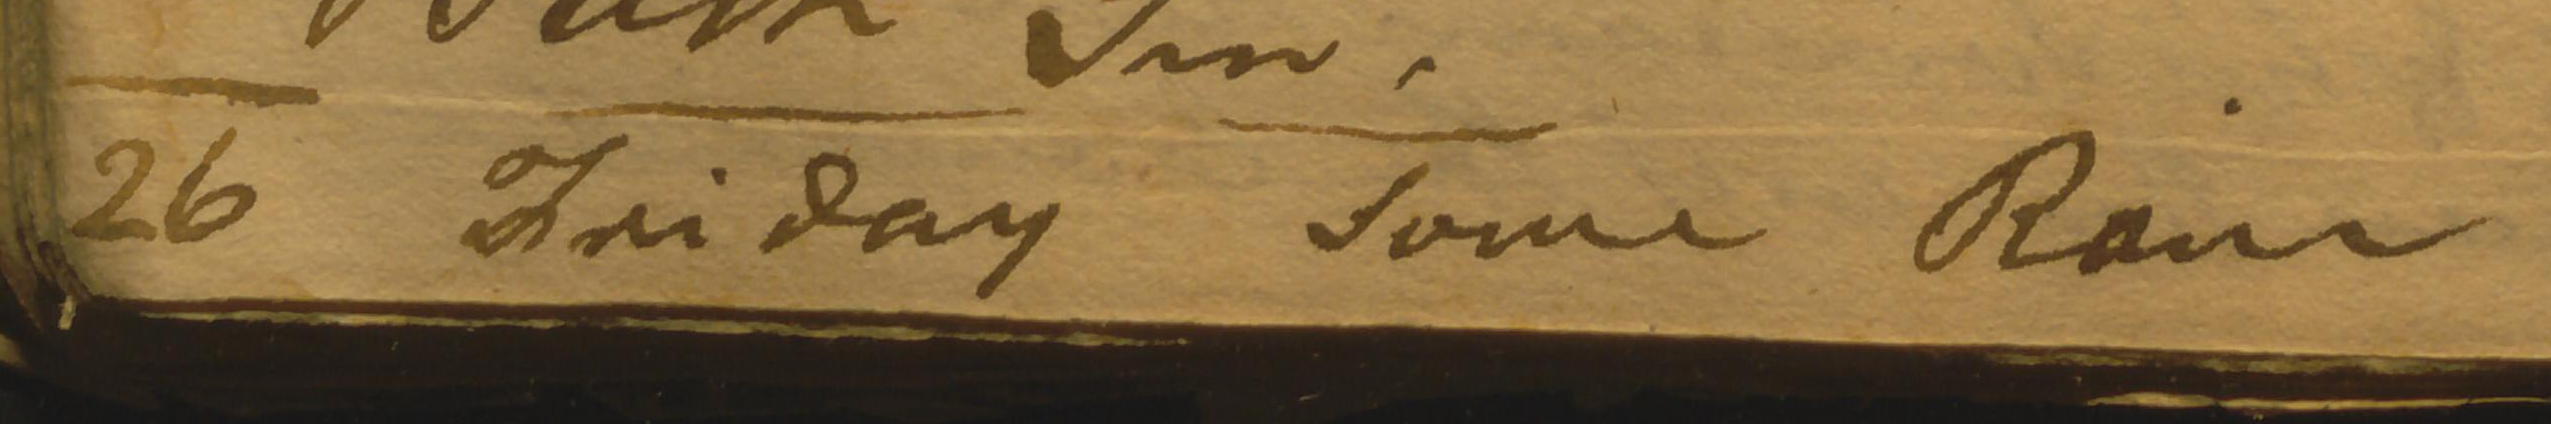26 Friday some Rain
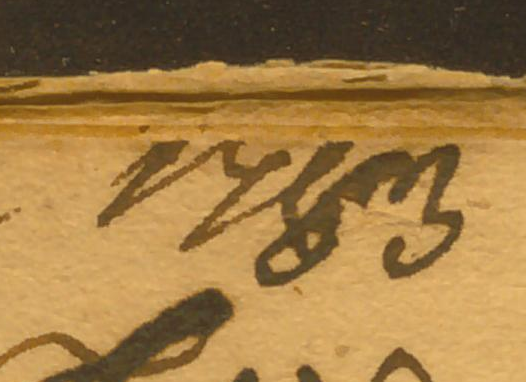1783
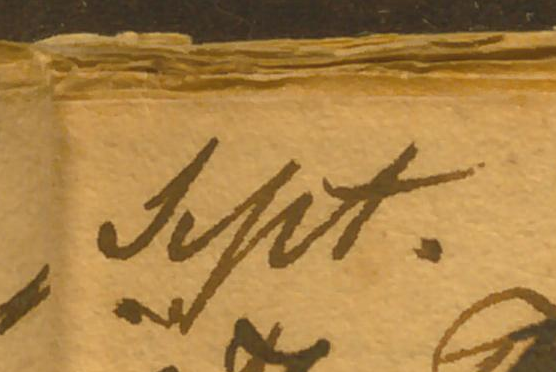Sept.
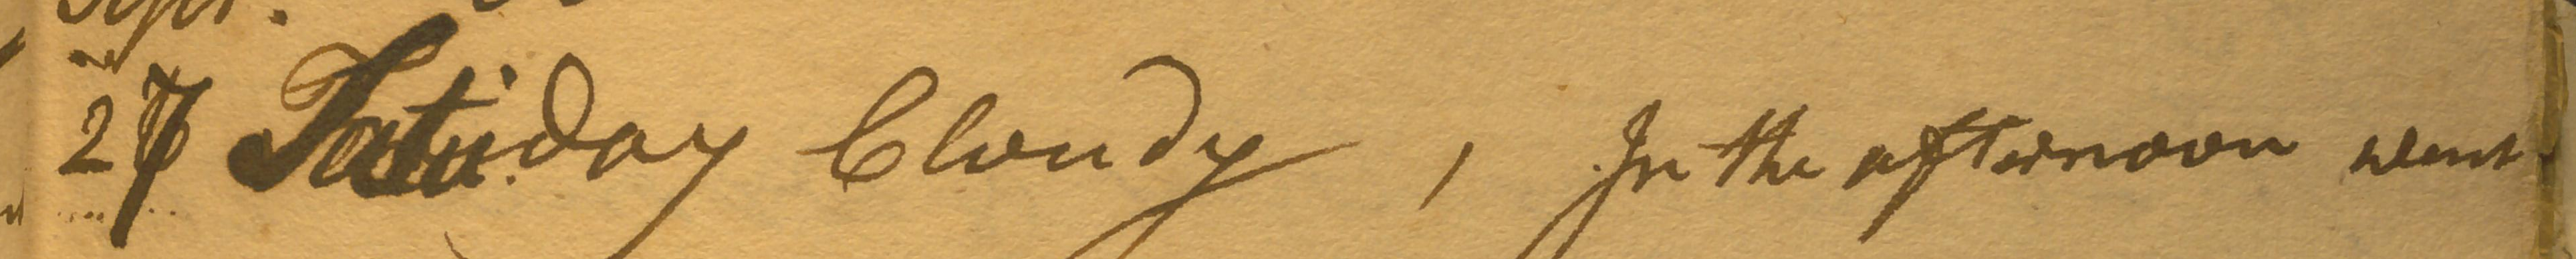28 Satuday Cloudy, In the afternoon went
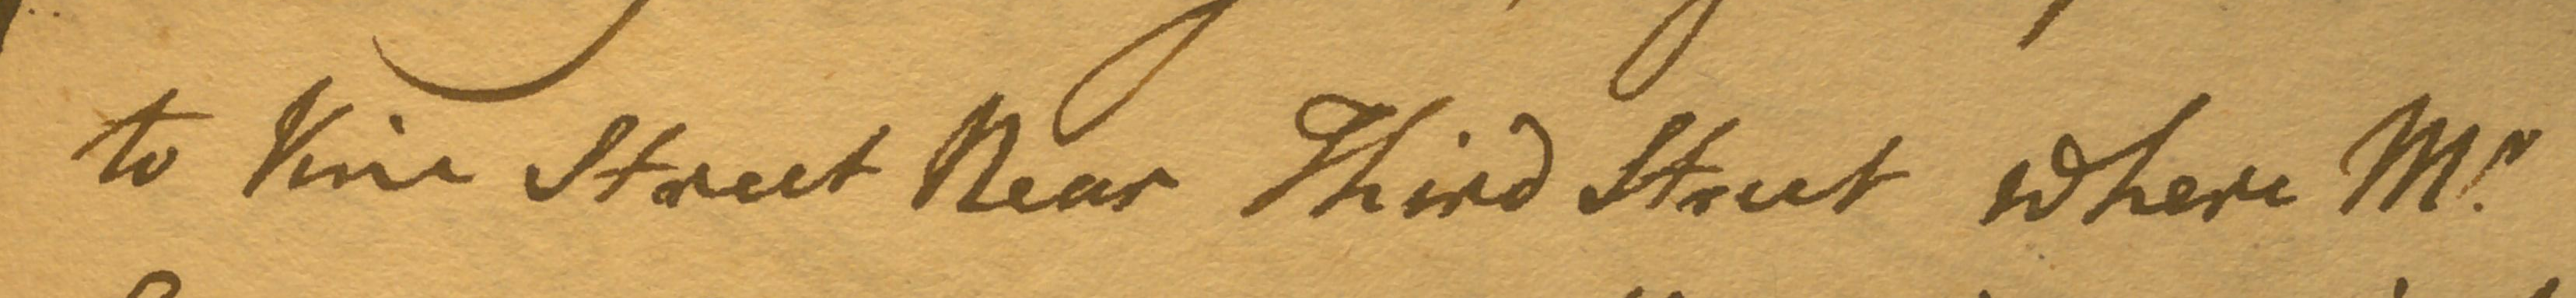to Vine Street Near Thid Street where M^r.
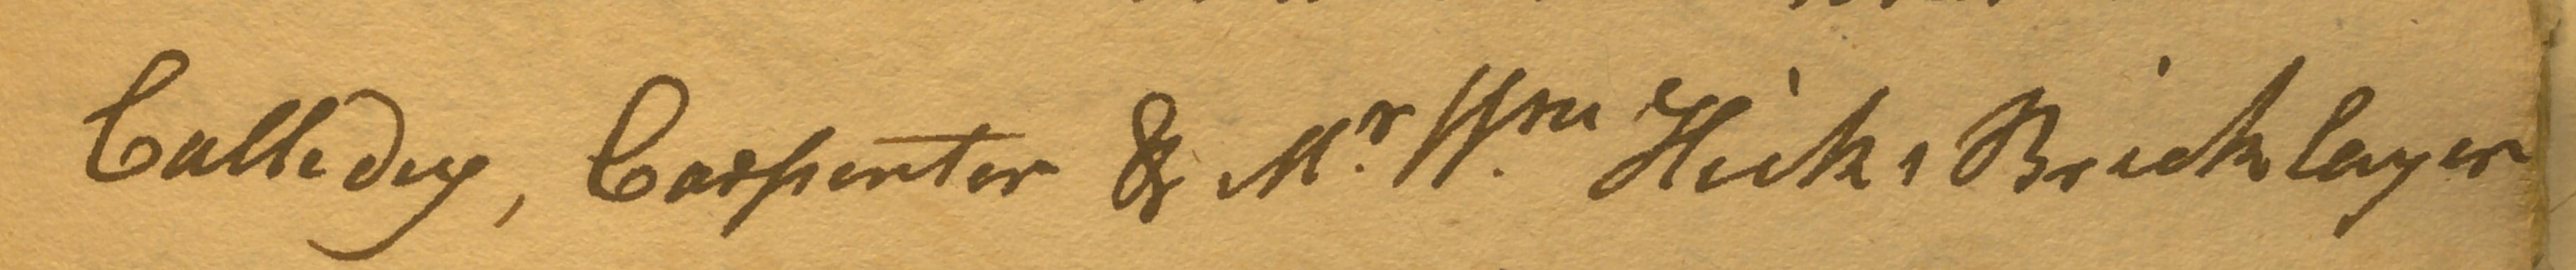Calledey Carpenter & M^r. W^m. Hicks Bricklayer
